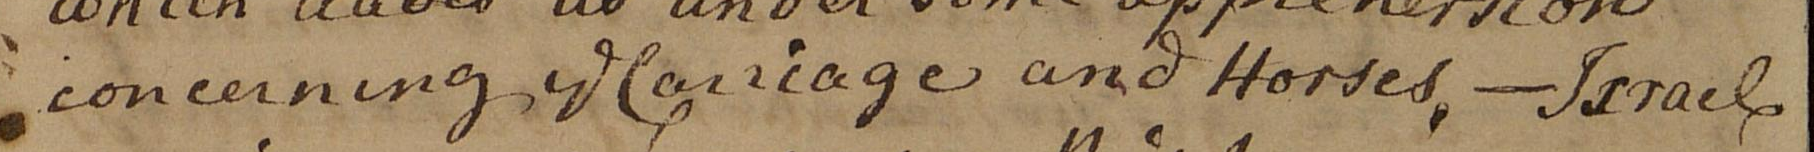concerning y^e Carriage and Horses- Israel
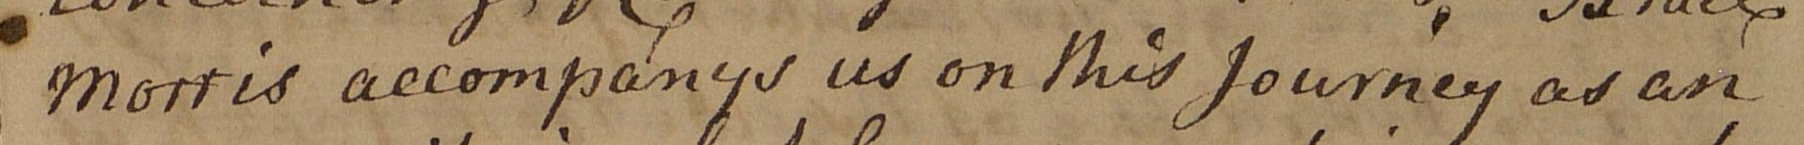Morris accompanys us on this Journey as an
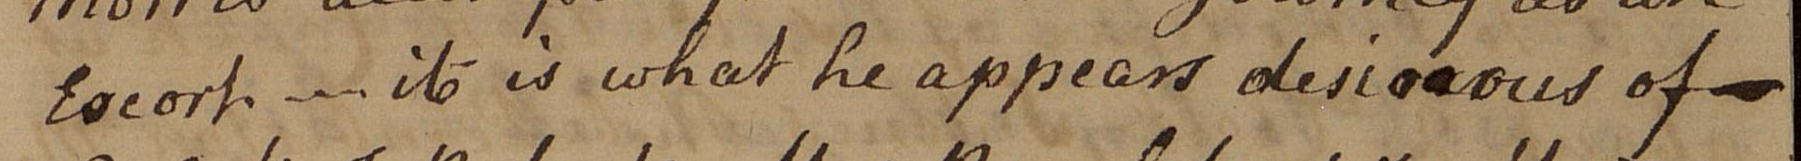Escort- it is what he appears desiraous of
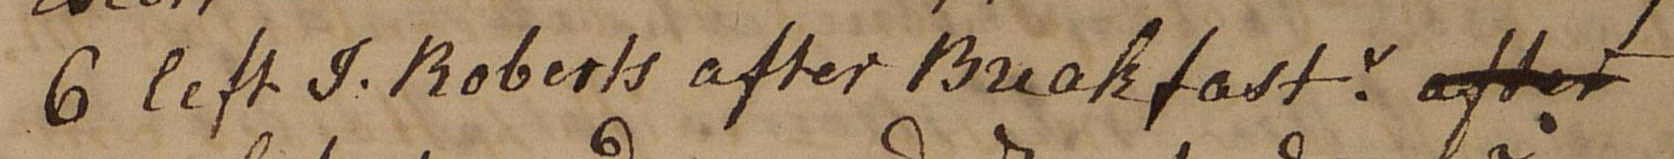6 left J. Roberts after Breakfast^s. after
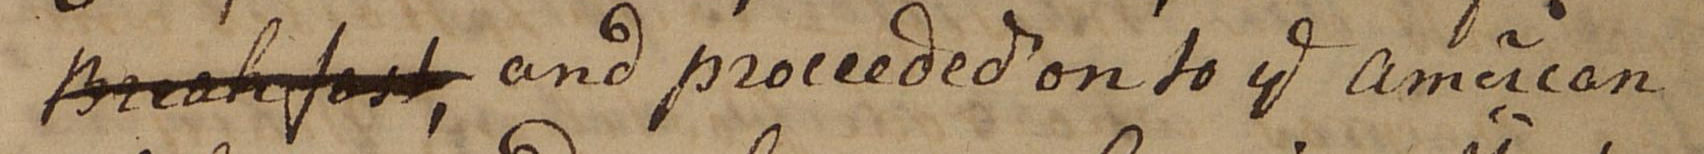Breakfast, and proceeded on to y^e Ame^rican
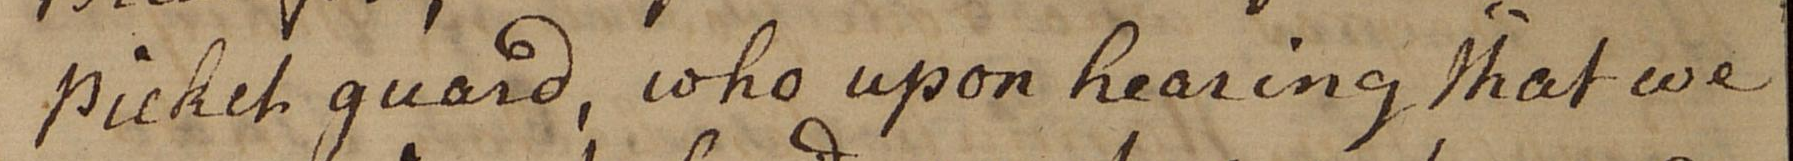Picket guard, who upon hearing that we
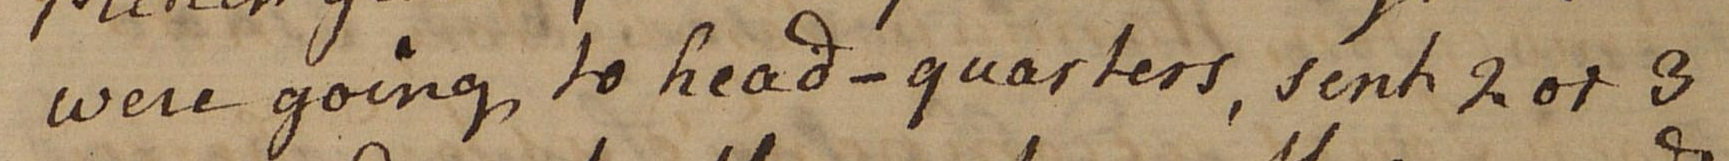were going to head- quarters, sent 2 or 3
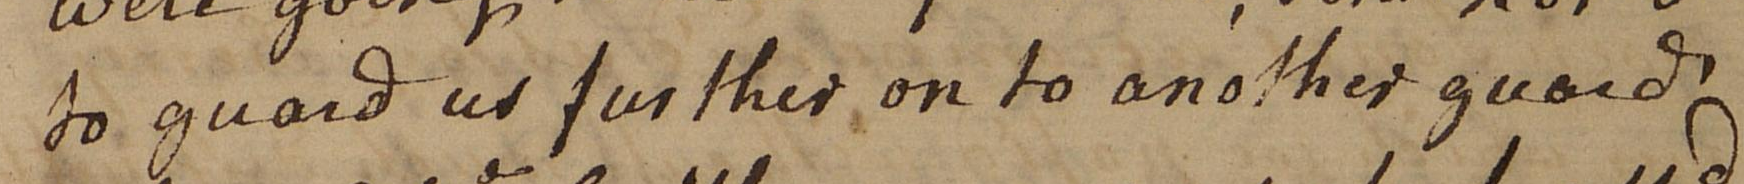to guard us further on to another guard
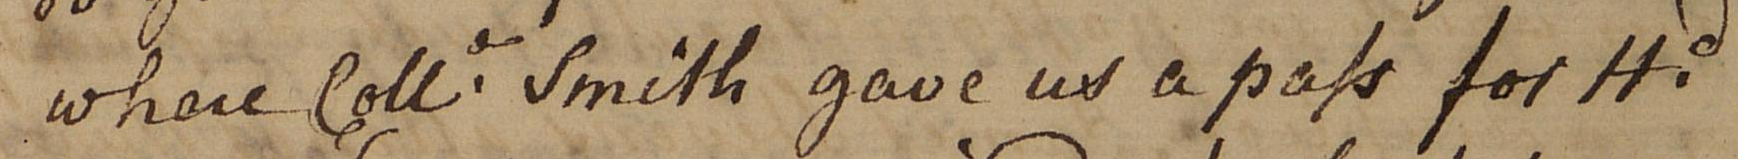where Coll^l. Smith gave us a pass for H^d.
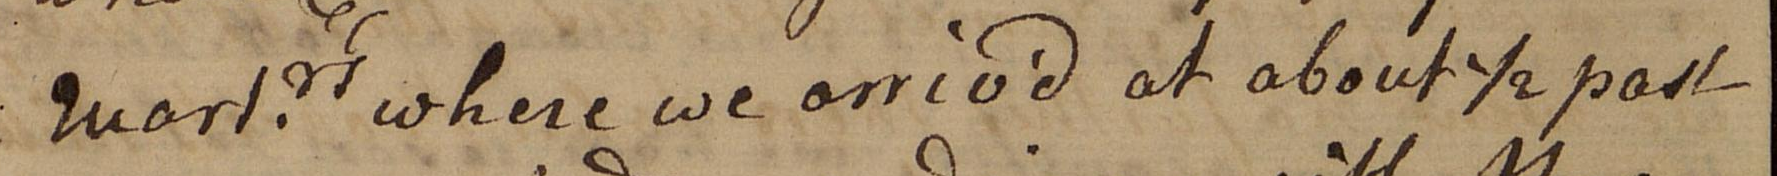Quart^rs. where we arriv'd at about 1/2 past
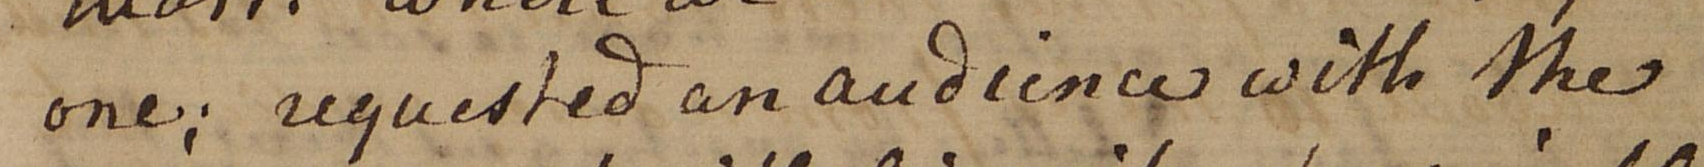one; requested an audience with the
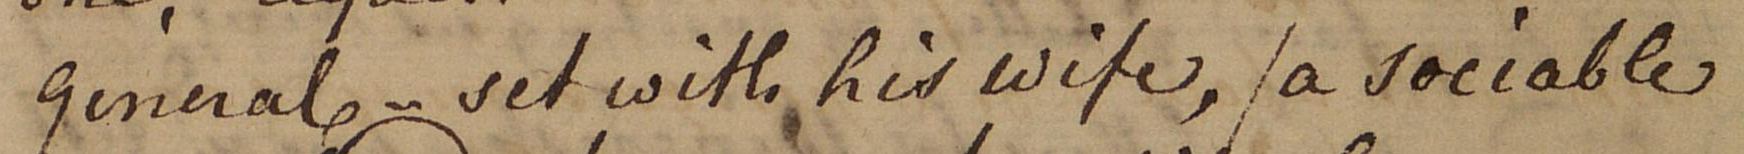general- set with his wife, /a sociable
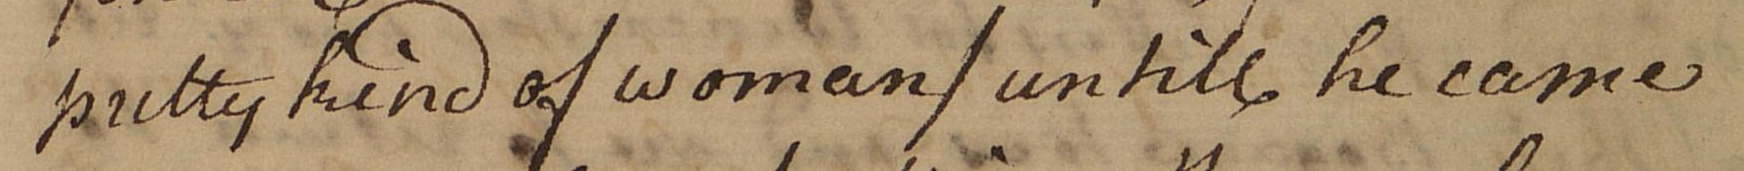pretty kind of woman/ untill he came
